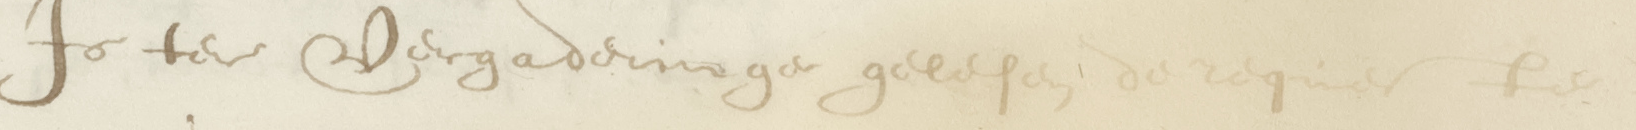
Is ter vergaderige gelesen de requeste
